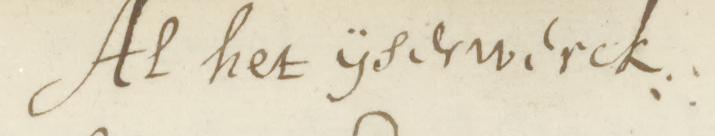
Al het ijserwerck.
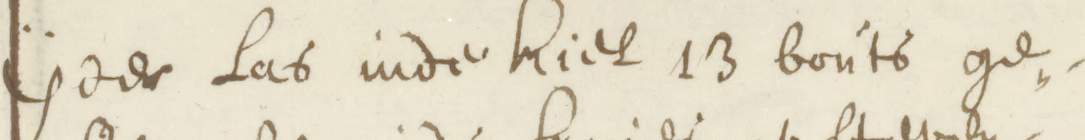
IJder las inde kiel 13 bouts ge„
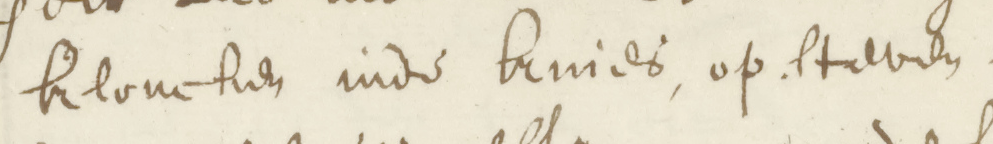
kloncken inde knies, op steven
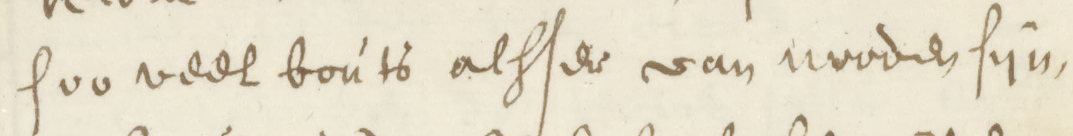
soo veel bouts alsser van nooden sijn,
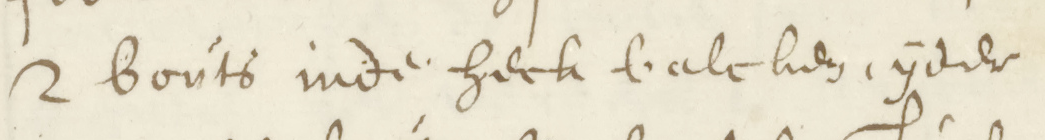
2 bouts inde heck balcken, ijder
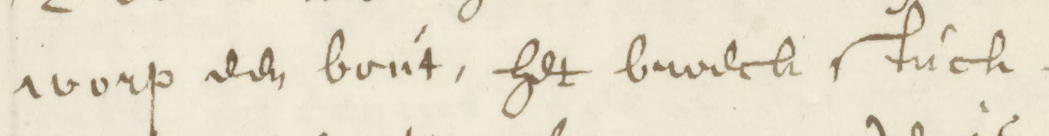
worp een bout, het broeck stuck
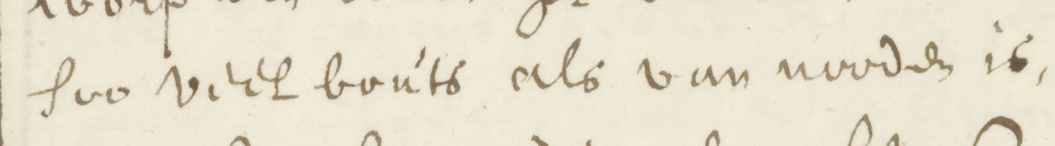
soo veel bouts als van nooden is,
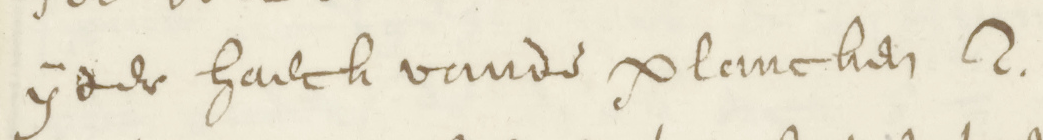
ijder haeck vande plancken 2.
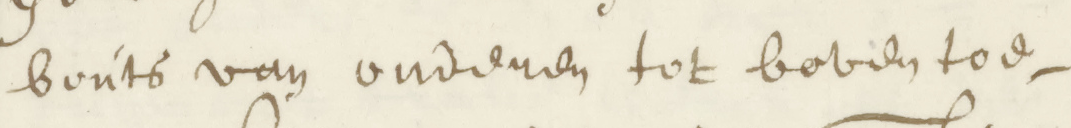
bouts van onderen tot boven toe
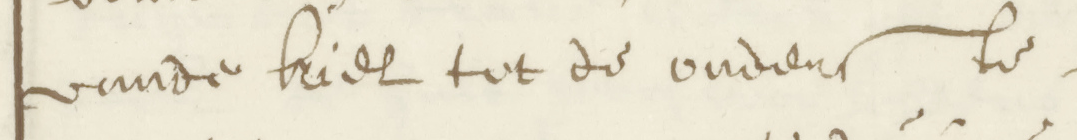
vande kiel tot de onderste
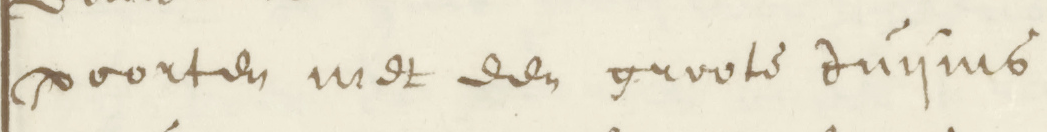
poorten met een groote duijms
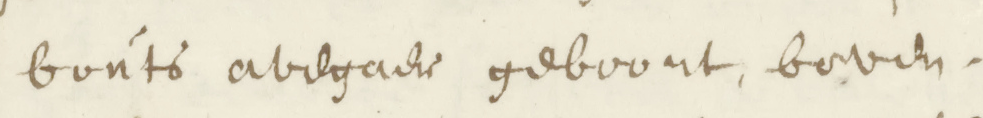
bouts avegaer geboort, boven
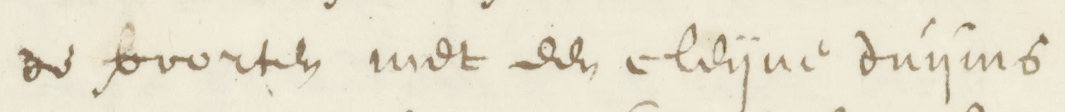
de poorten met een cleijne duijms
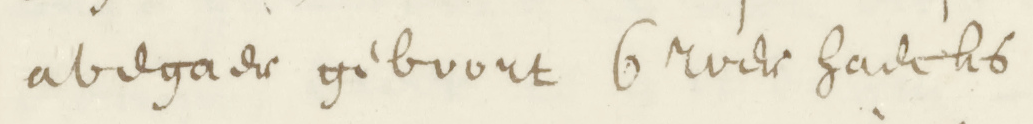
avegaer geboort 6 roer haecks
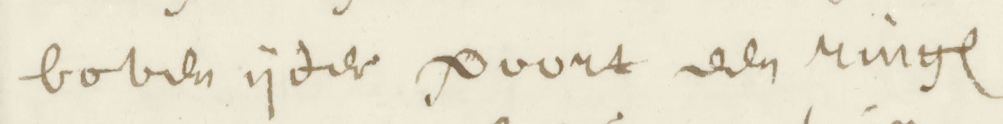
boven ijder poort een ringh
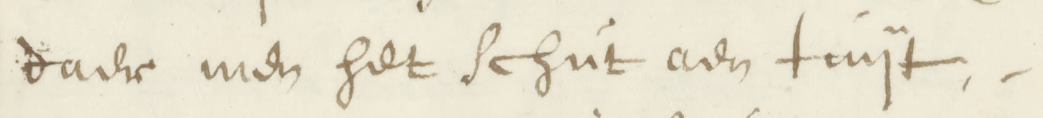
daer men het schut aen tuijt,
